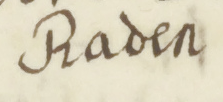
Raden
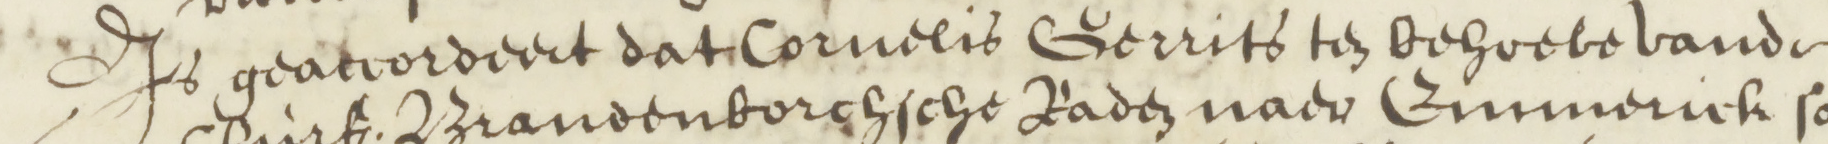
Is geaccordeert dat Cornelis Gerrits ten behoeve vande
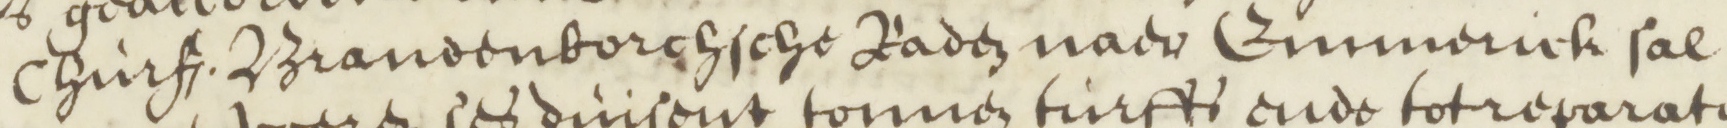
Churf. Brandenborchsche Raden naer Emmerick sal
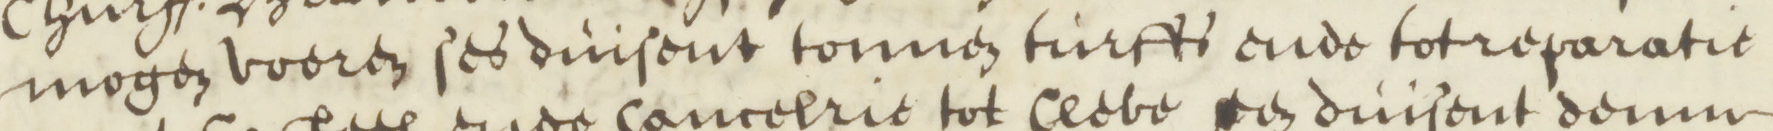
mgen voeren ses duysent tonnen turfs ende tot reparatie
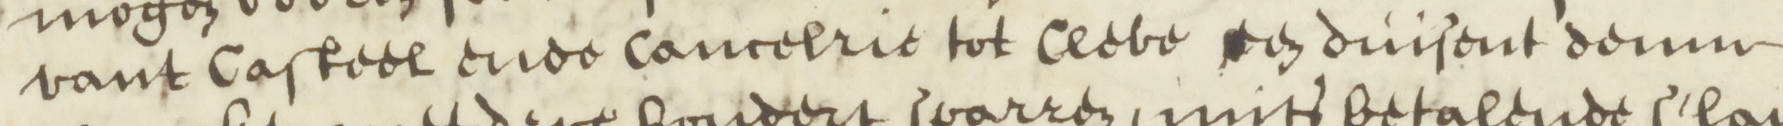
vant Casteel ende Cancelrie tot Cleve een duisent denne
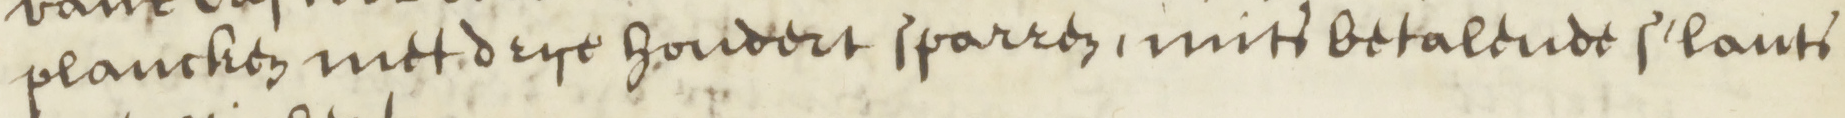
plancken met drye hondert sparren, mits betalende s'lants
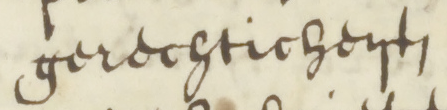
gerechticheyt.
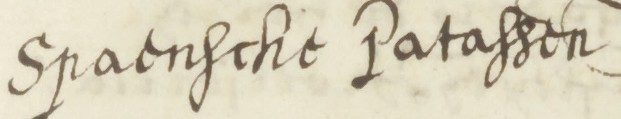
Spaensche patassen
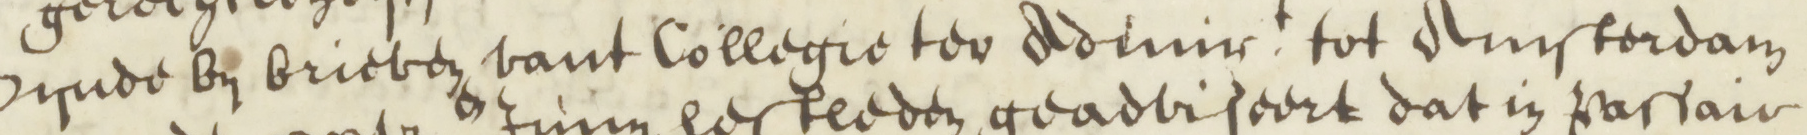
Synde bij brieven vant Collegie ter Admirt tot Amsterdam
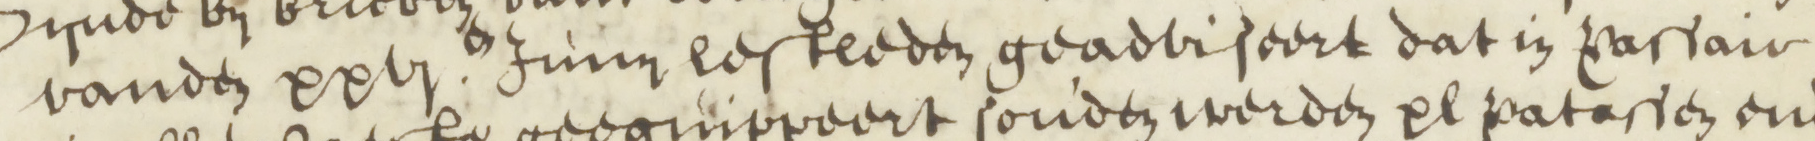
vanden xxvje Juny lestleden geadviseert dat in Passaie
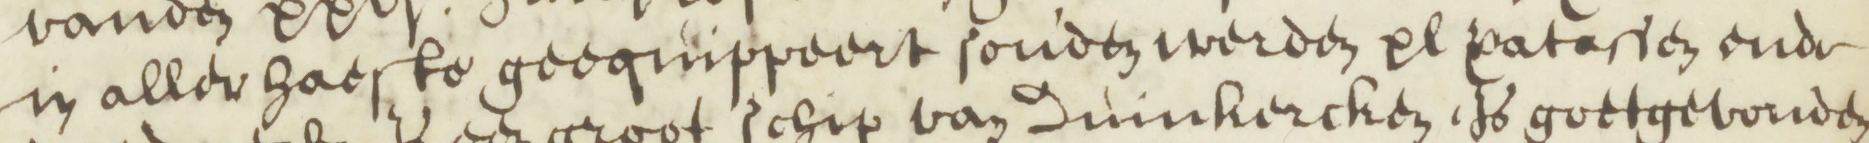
in allerhaeste geequippeert souden werden xl patassen ende
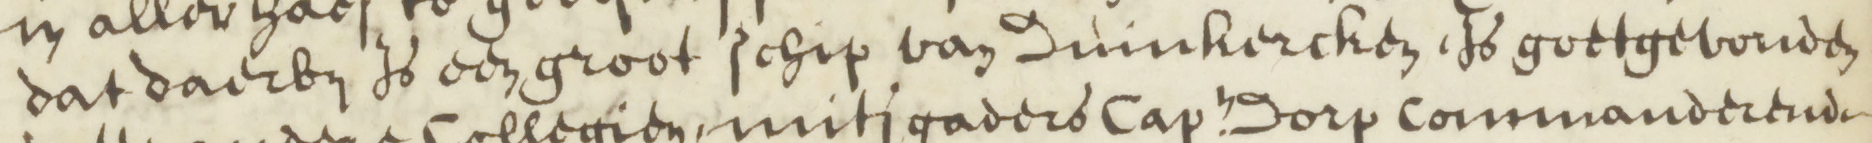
dat daerby is een groot schip van Duinkercken. Is goetgevonden
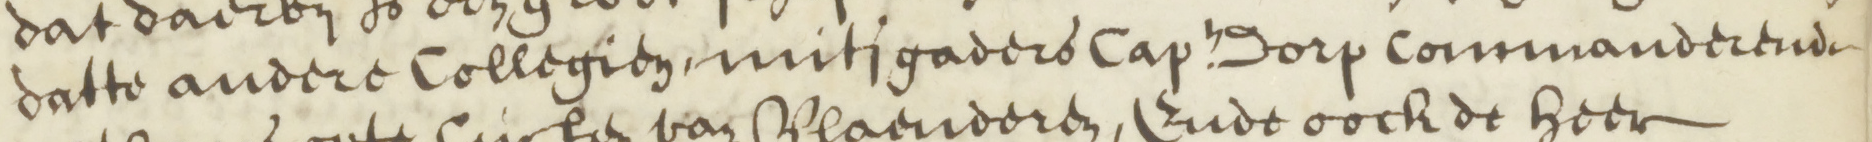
datte andere Collegien mitsgaders Capn Dorp commanderende
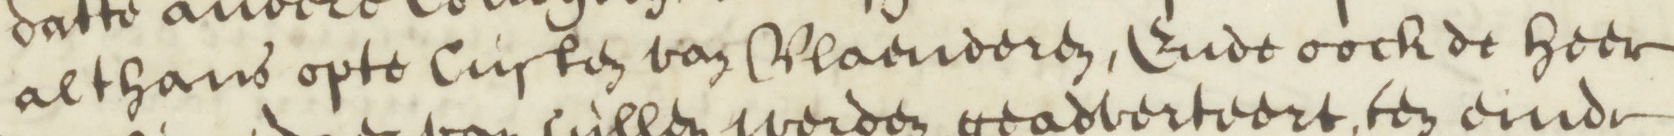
althans opte custen van Vlaenderen, Ende oock de heer
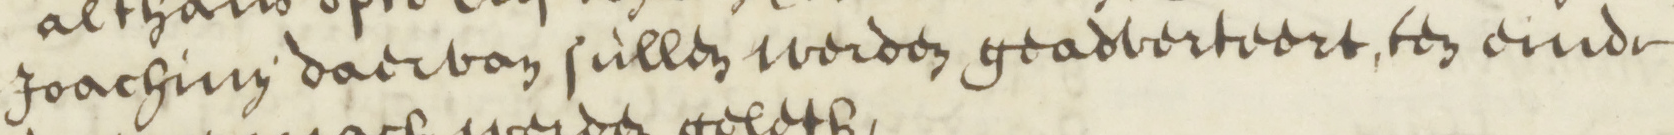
Joachimi daervan sullen worden geadverteert, ten einde
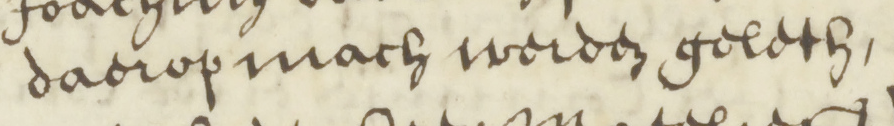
daerop mach worden geleth.
